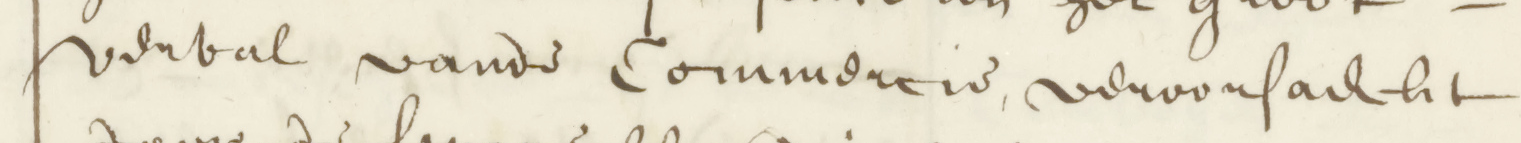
verval vande Commercie, veroorsaeckt
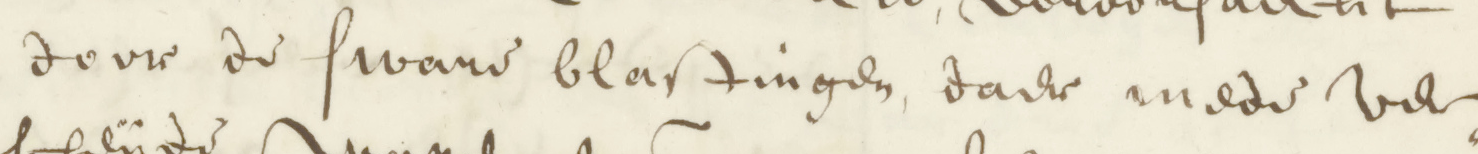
door de sware blastingen daer mede ver„
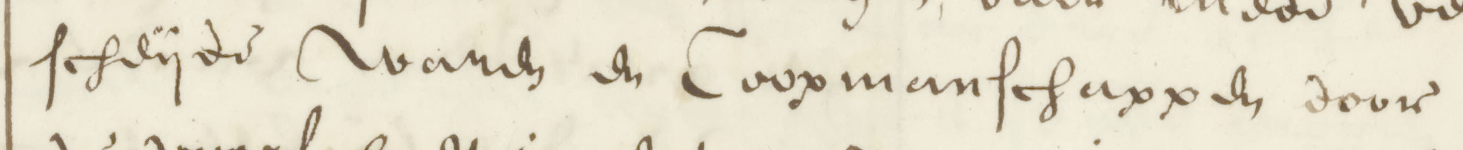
scheijde waren en Coopmanschappen door
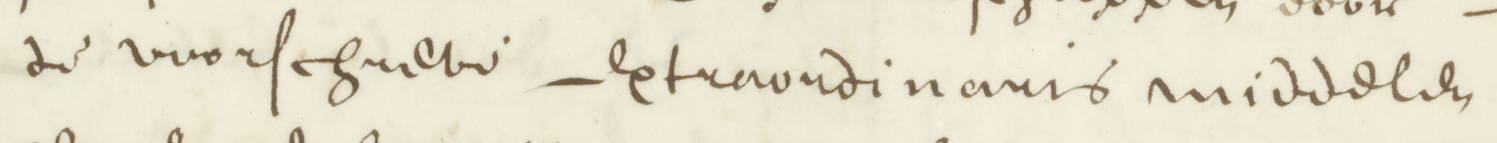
de voorschreve extraordinaris middelen
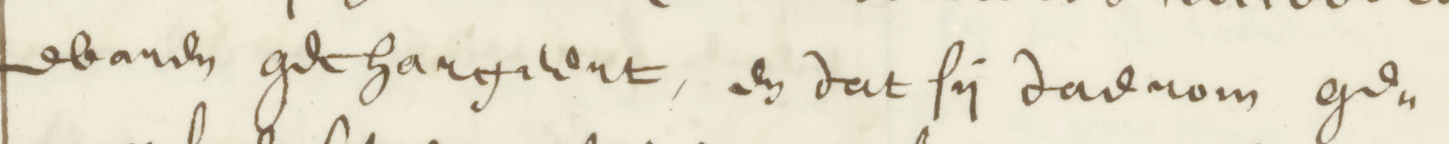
waren gechargeert, en dat sij daerom ge„
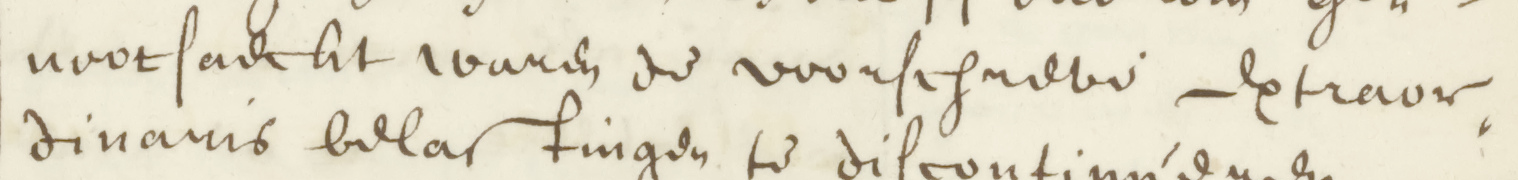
nootsaeckt waren de voorschreve extraor,,
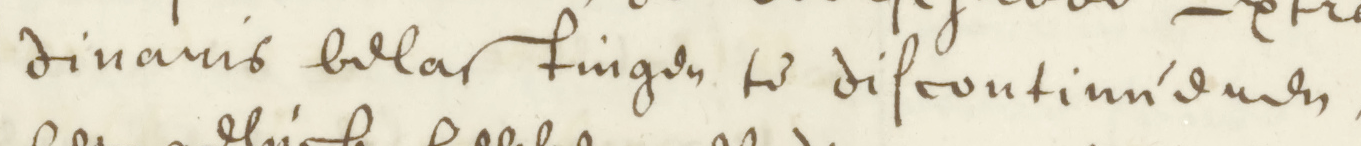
dinaris belastingen te discontinueren
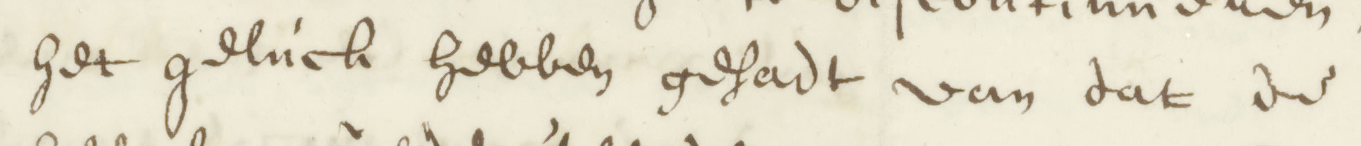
het geluck hebben gehadt van dat de
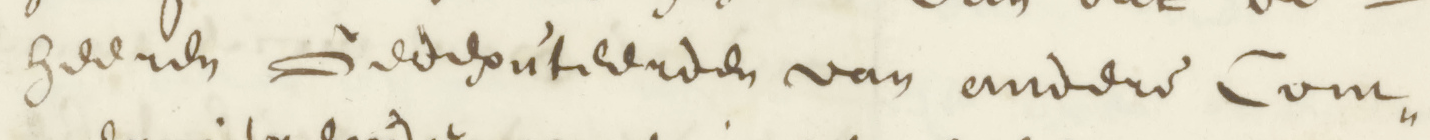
heeren Gedeputeerden van andere Com„
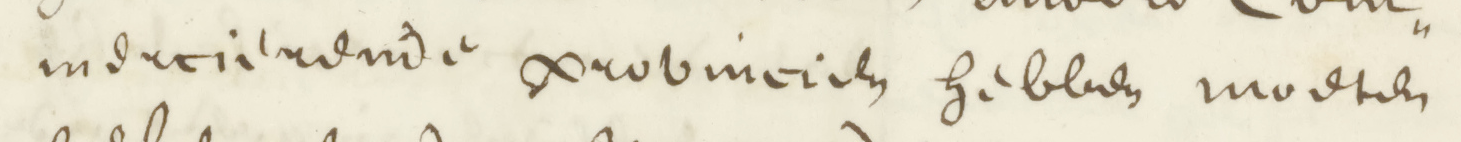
mercierende provincien hebben moeten
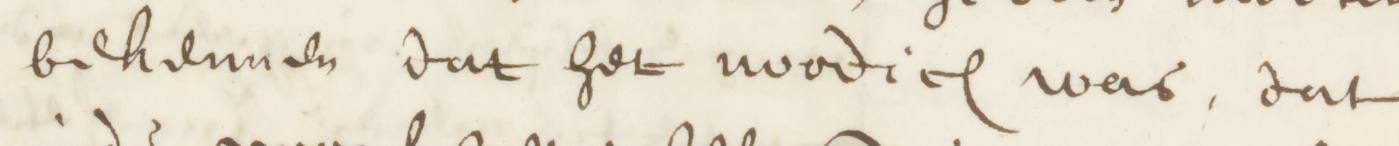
bekennen dat het noodich was, dat
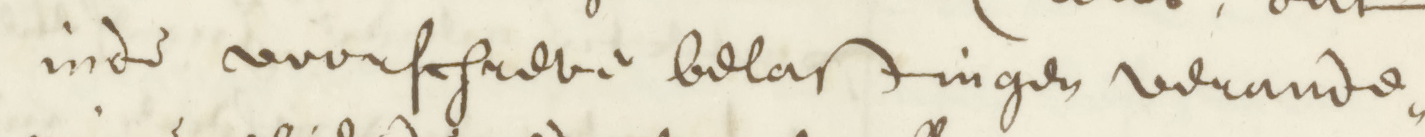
inde voorschreve belastingen verande„
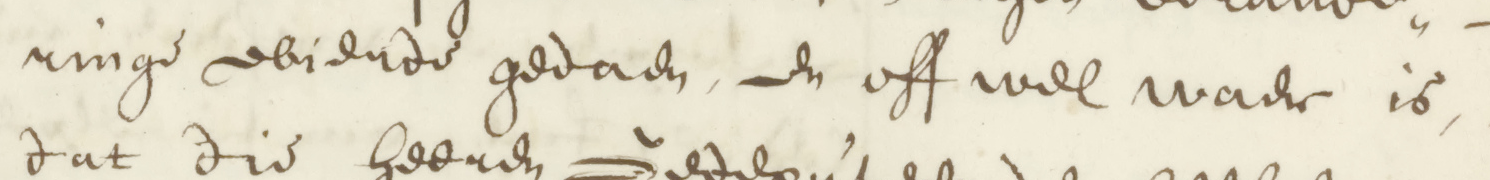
ringe wierde gedaen, en oft wel waer is,
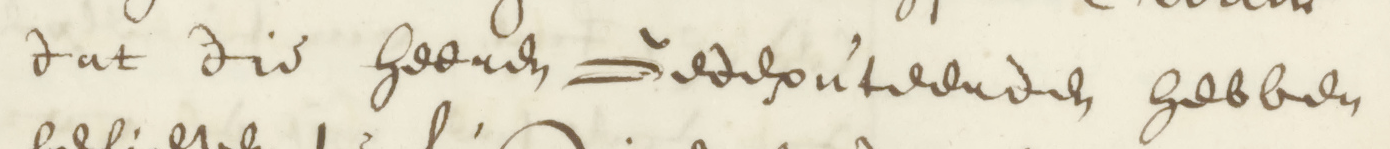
dat die heeren Gedeputeerden hebben
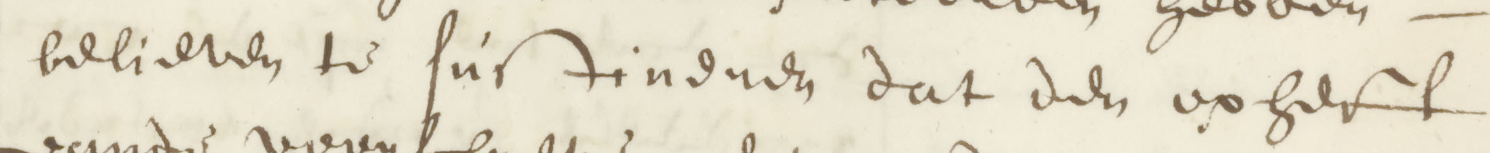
believen te sustineren dat den opheff
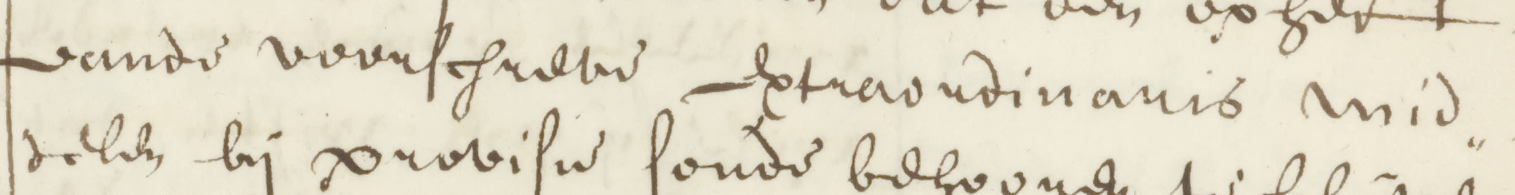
vande voorschreve extraordinaris mid,,
